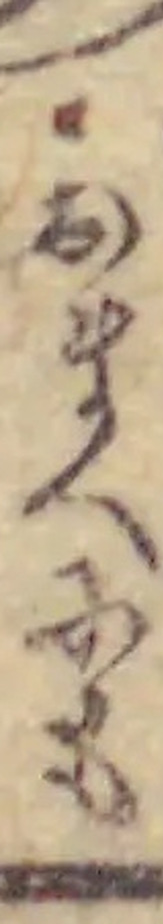おまへにも
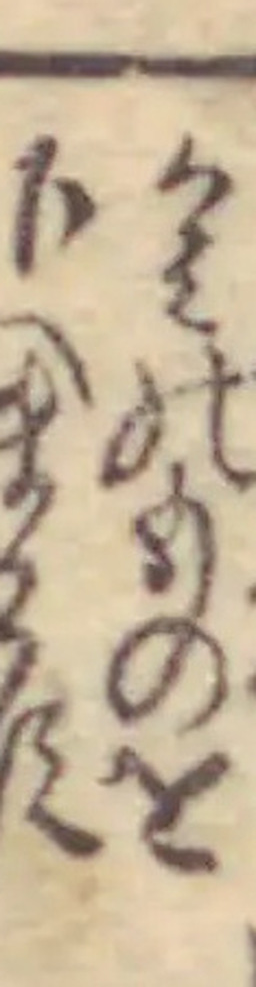下へまわす
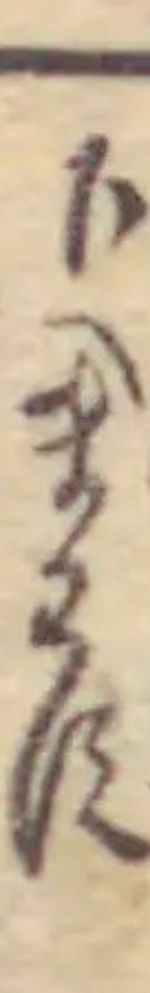下へまわす
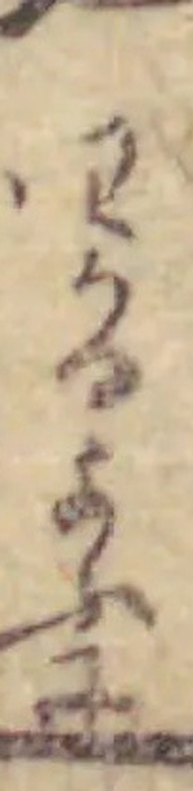わかるよふに
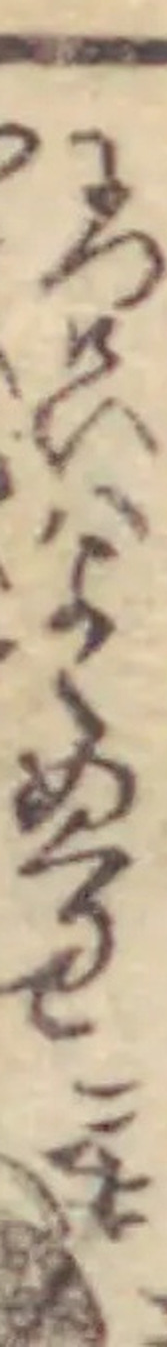につけいはよくめくりて
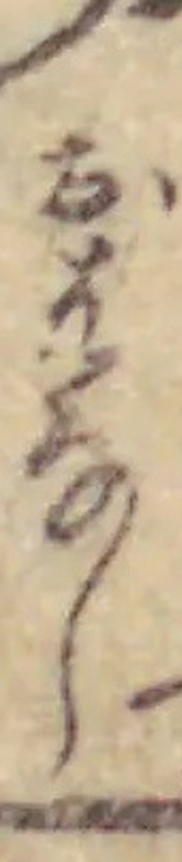おはなし
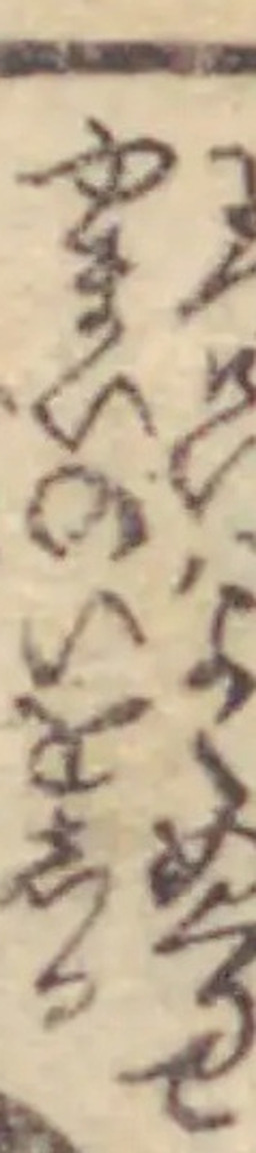やまいのいをしる
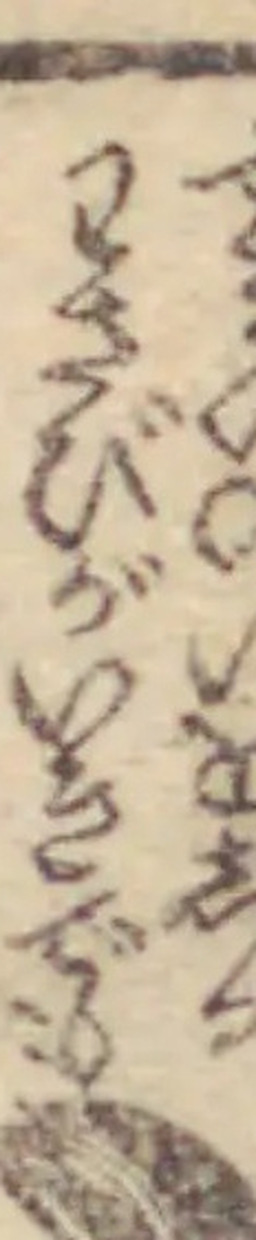わさびがいきでも
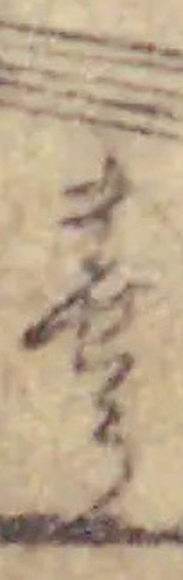ませう
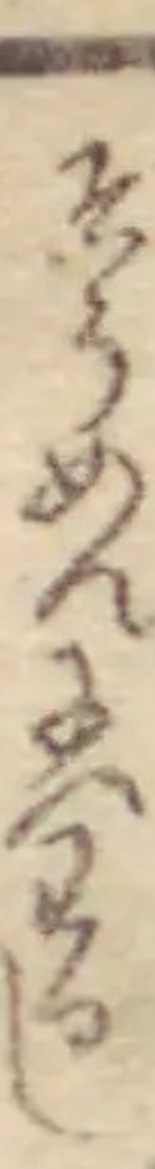そうめんにはわるし
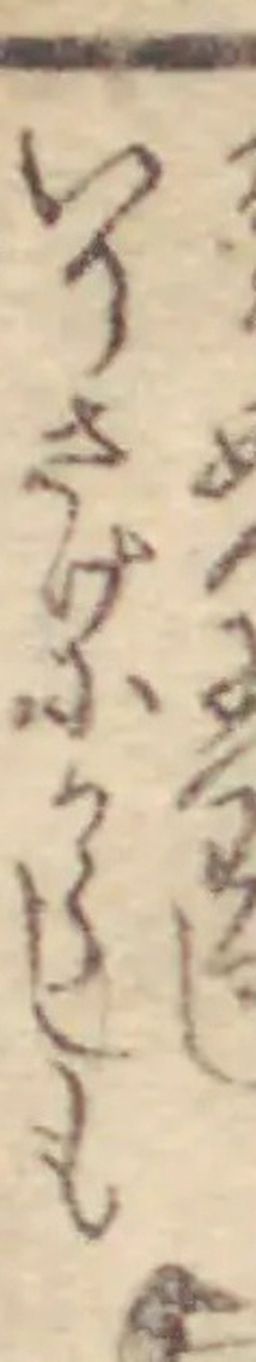いりさけにからしも
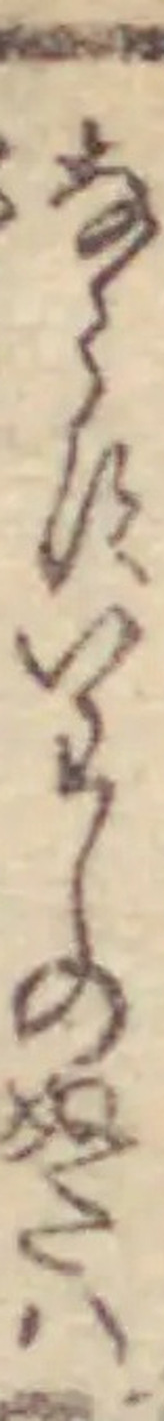ならすいわしのぬたは
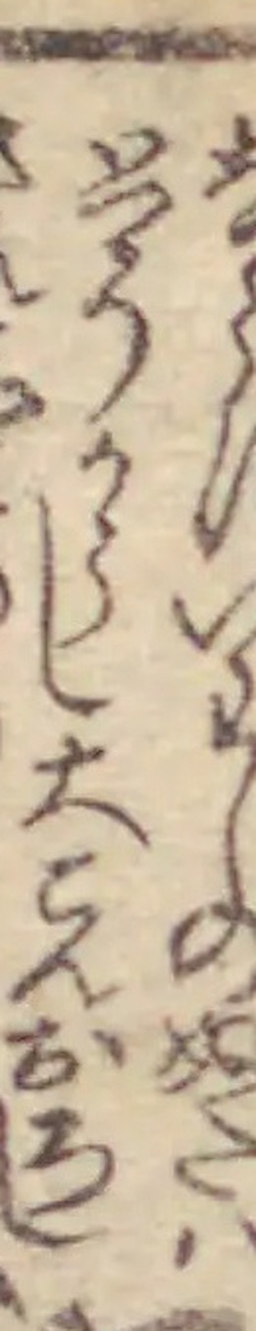とうからし大こんおろし
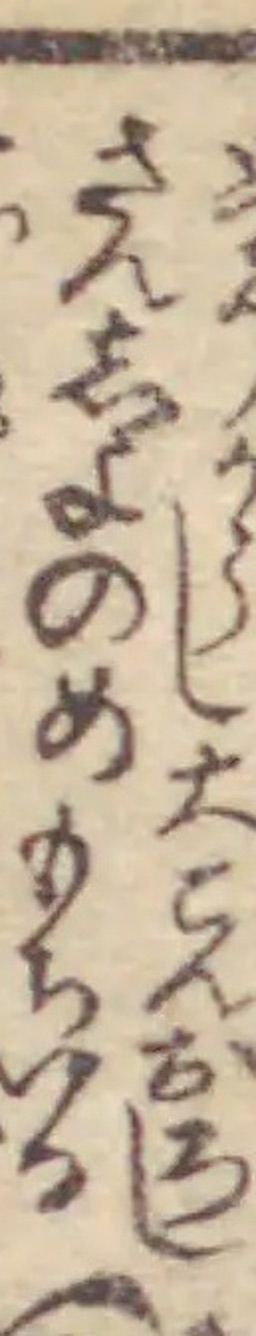さんしよのめもちいる
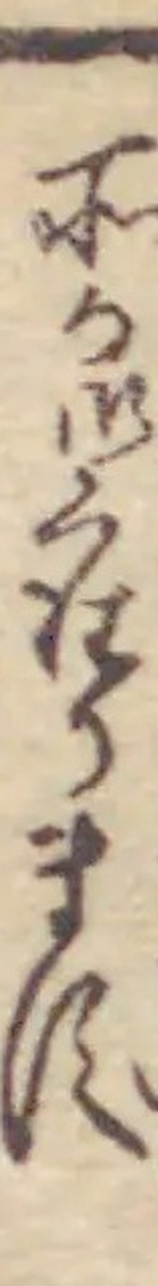所か御座ります
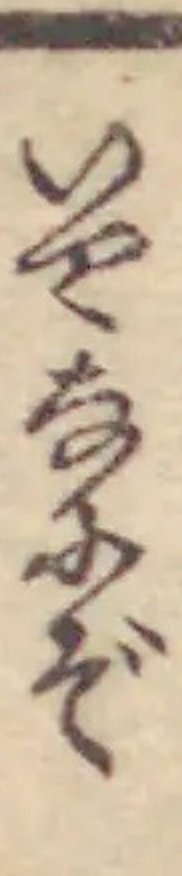いてなにぞ
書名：家伝寿命薬 2巻
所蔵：国立国会図書館 National Diet Library, JAPAN
